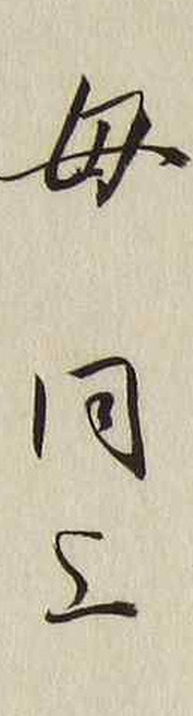母同上

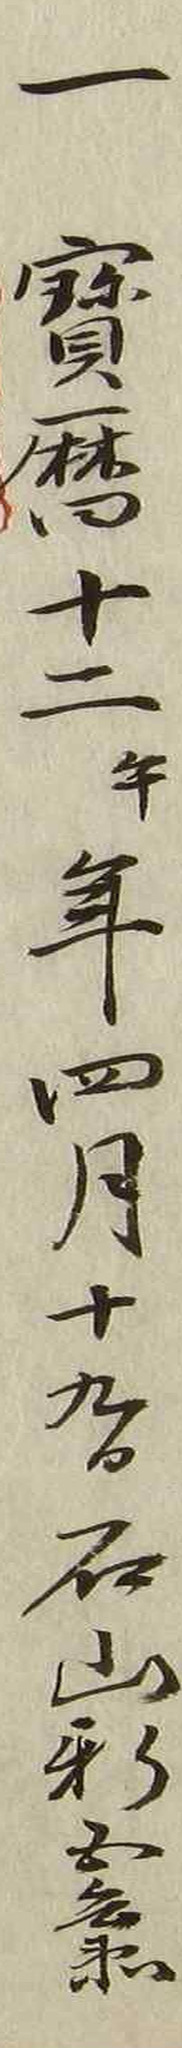一宝暦十二午年四月十九日石山新五兵衛
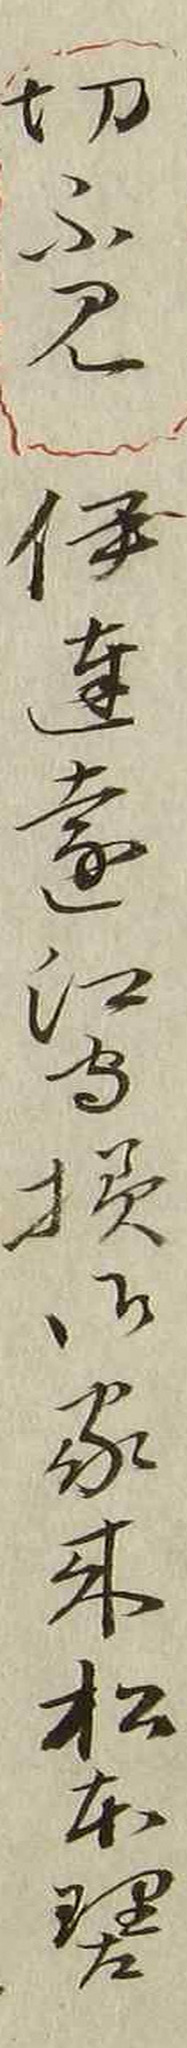見切れず伊達遠江守様御家来松本理左
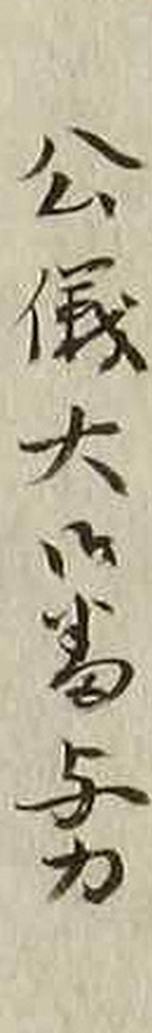公儀大御番与力
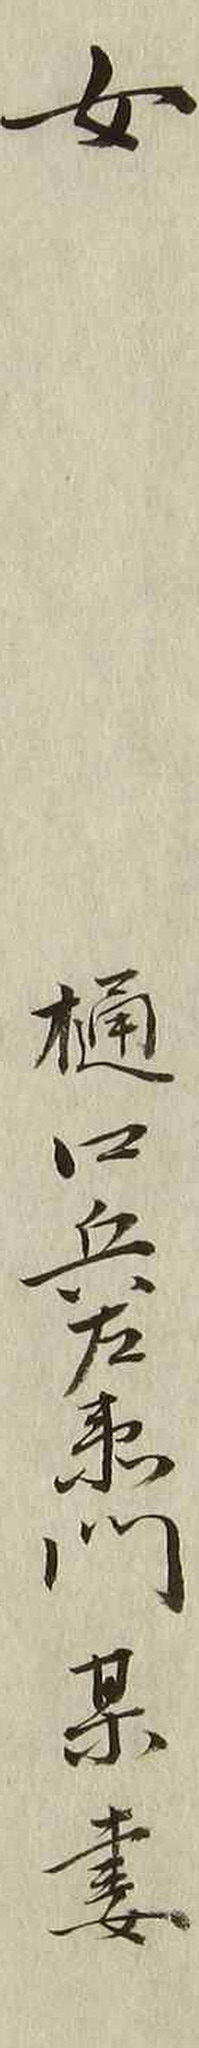女樋口兵左衛門某妻
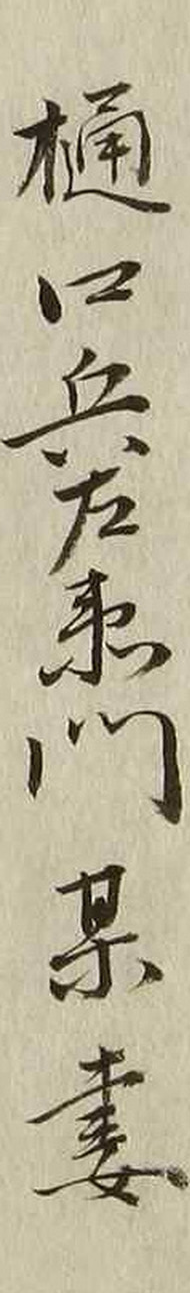女樋口兵左衛門某妻
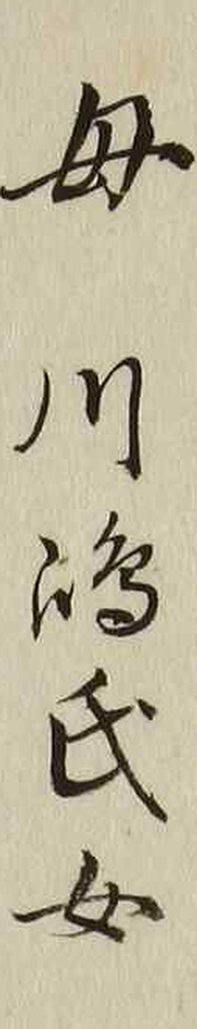母川嶋氏女
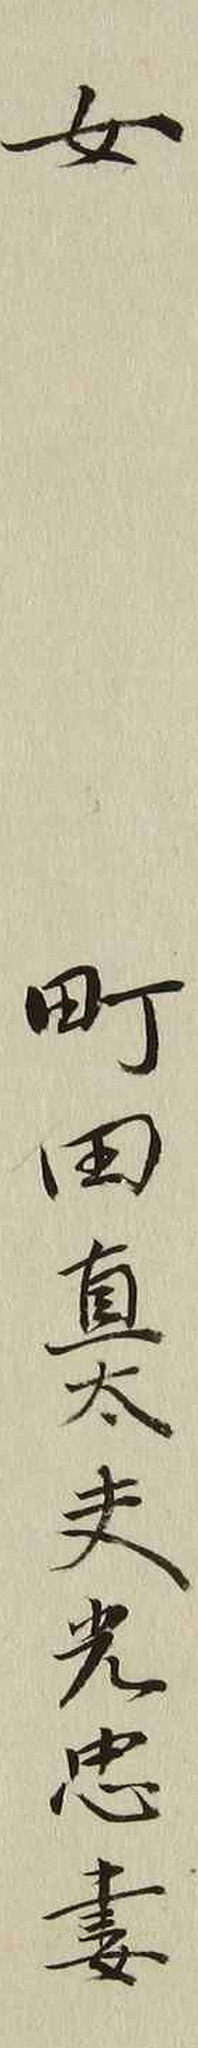女町田真太夫光忠妻
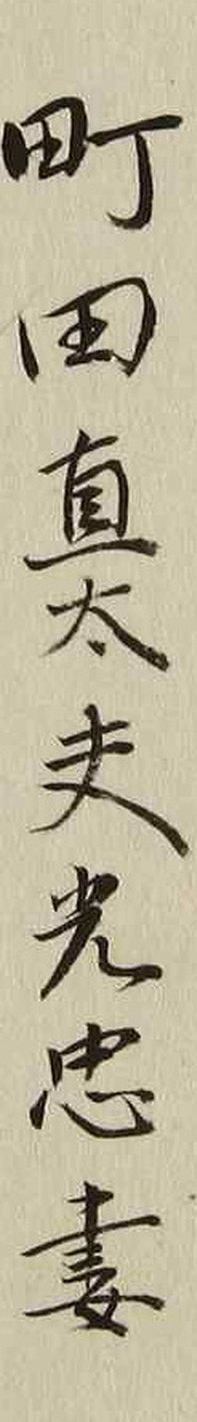女町田真太夫光忠妻
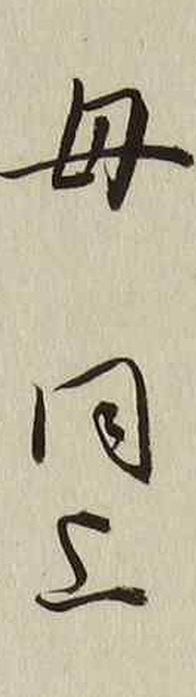母同上
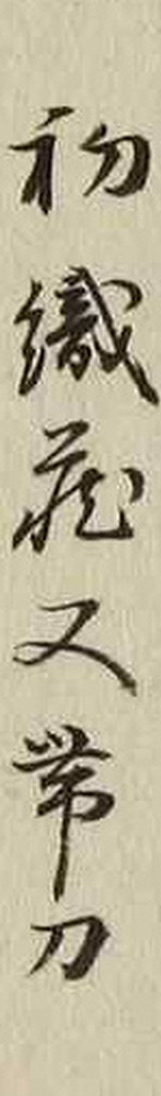初織蔵又帯刀
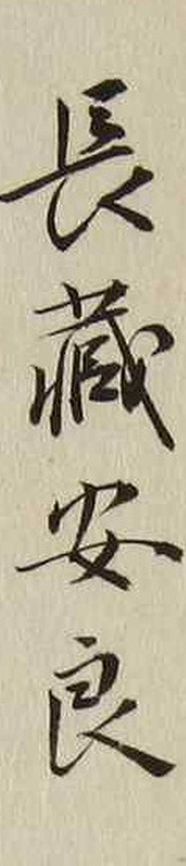長蔵安良
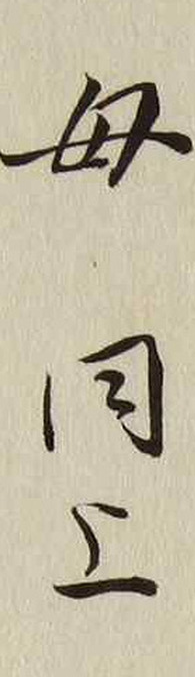母同上
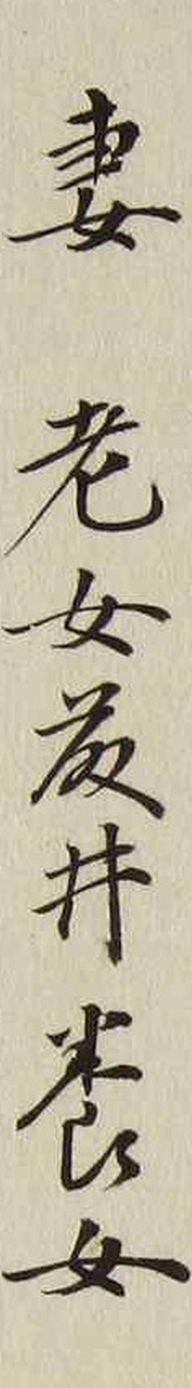妻老女藤井養女
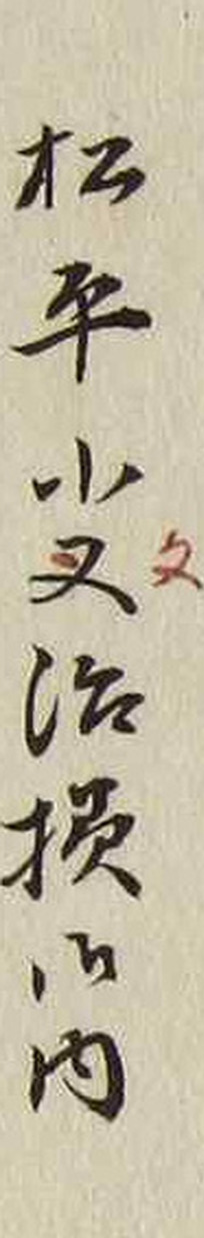松平小又治様御内
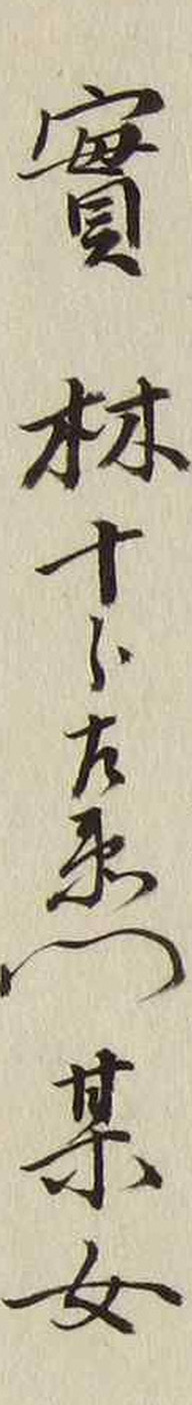実林十郎左衛門某女
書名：諸士系譜　巻之19　い之部19
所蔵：会津若松市立会津図書館
